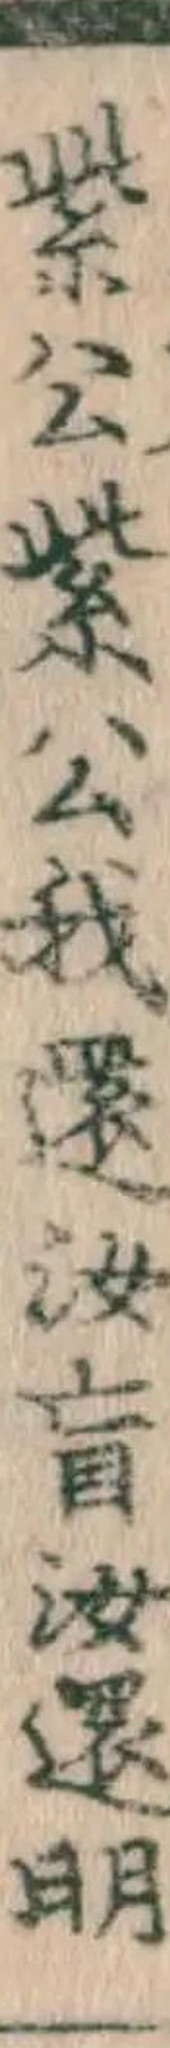紫公紫公我還汝盲汝還明
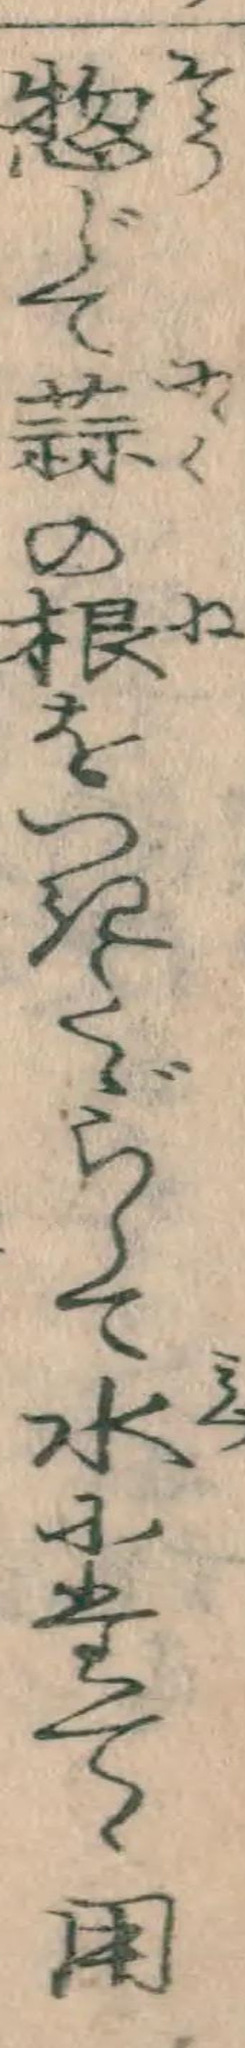惣じて蒜の根をつきたゞらして水にたてゝ用
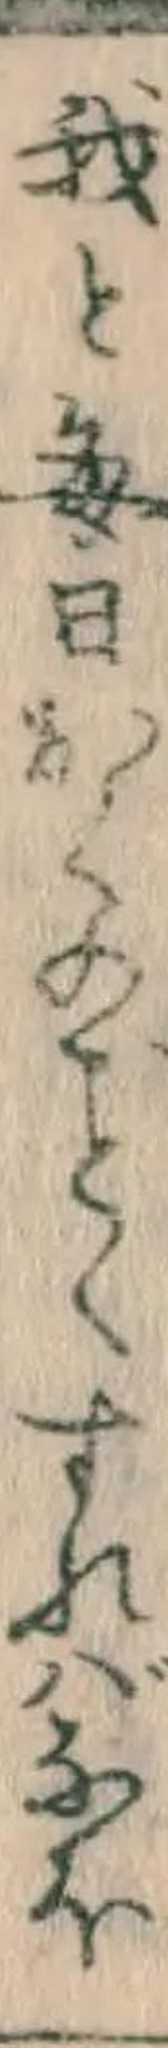我と毎日かくのごとくすればなほ
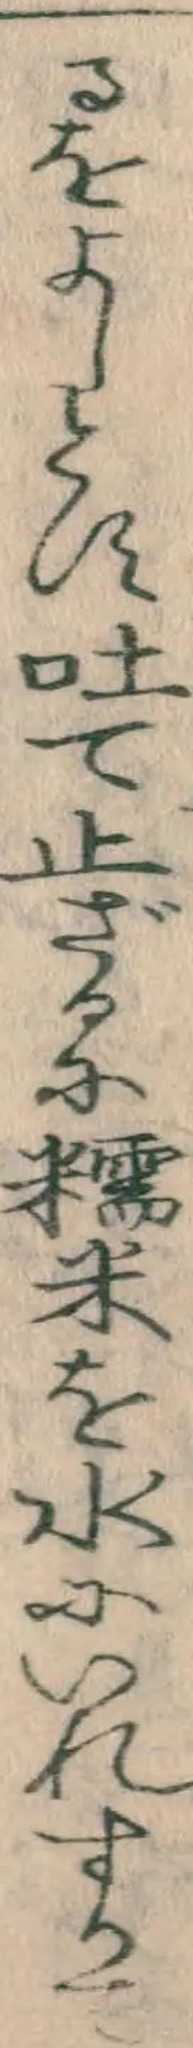るをよしとす吐て止ざるに糯米を水にいれすりて
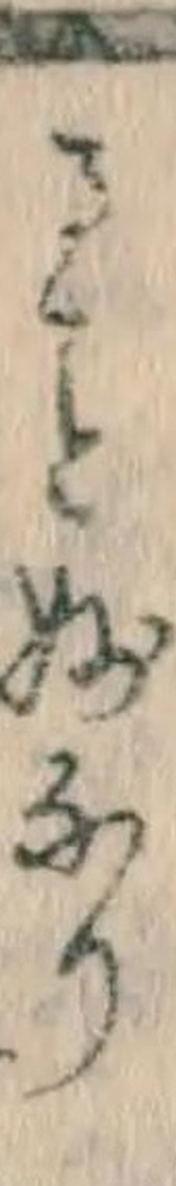ること妙なり
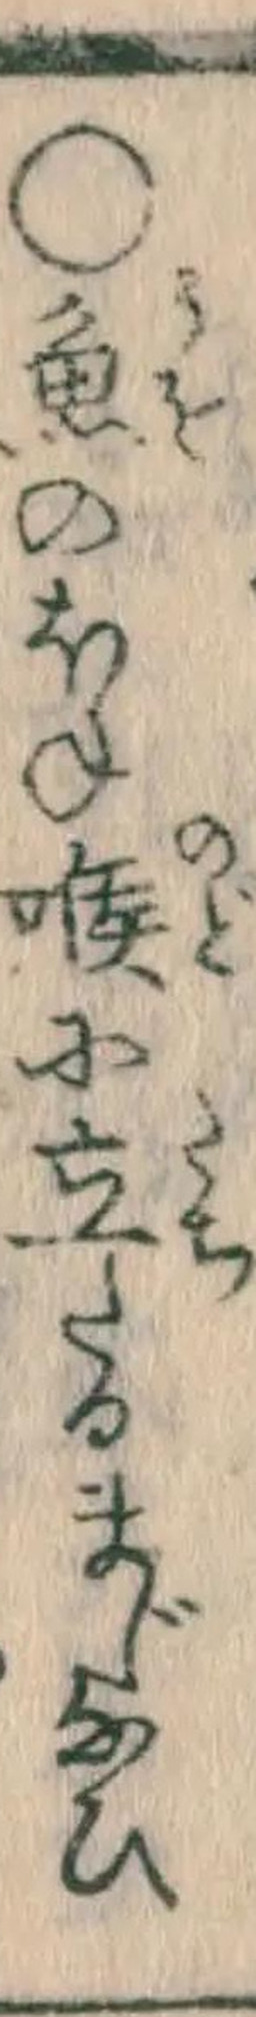○魚のほね喉に立たるまじなひ
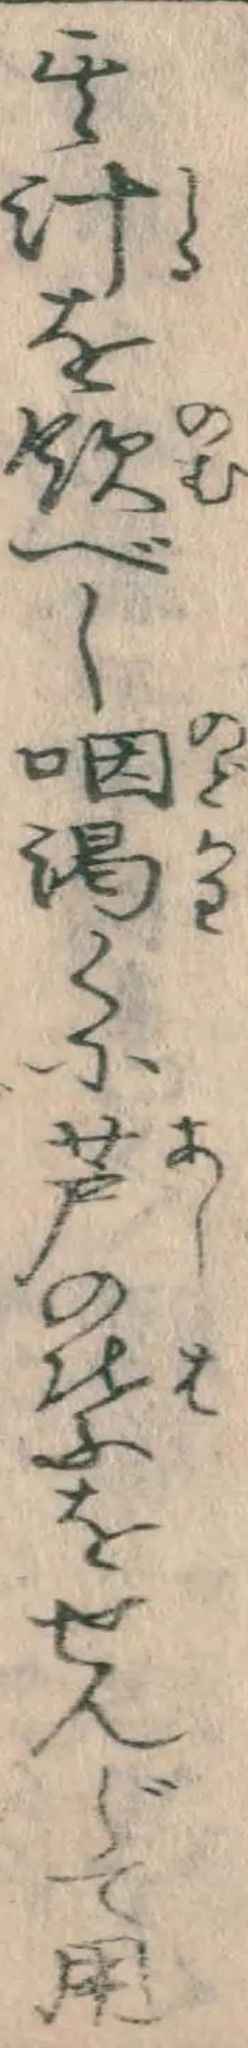其汁を飲べし咽渇くに芦の葉をせんじて用
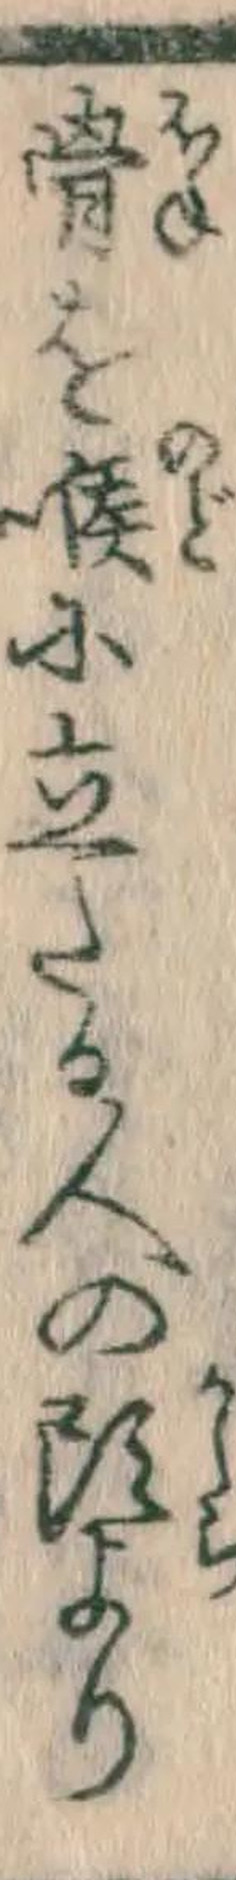骨を喉に立たる人の頭より
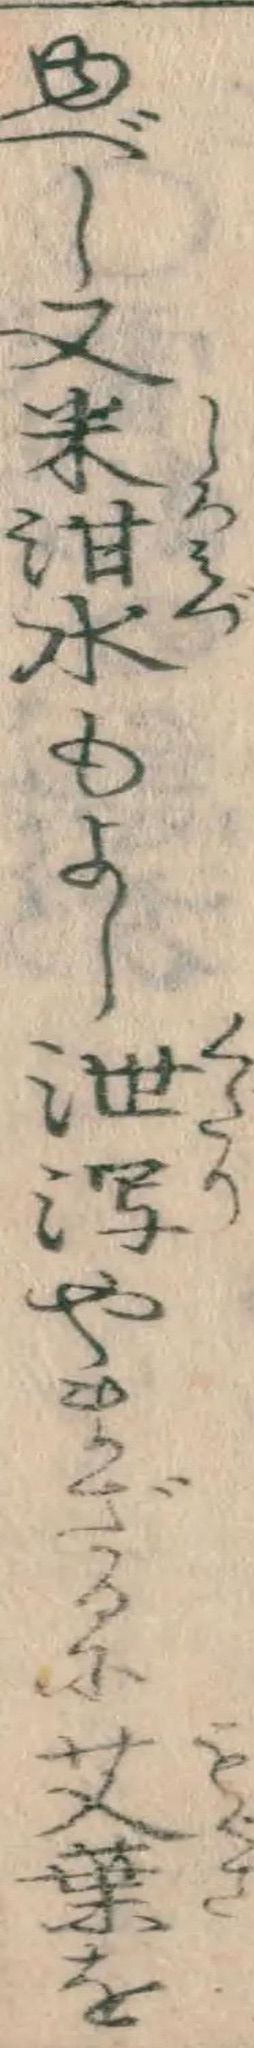ゆべし又米泔水もよし泄瀉やまざるに艾葉を
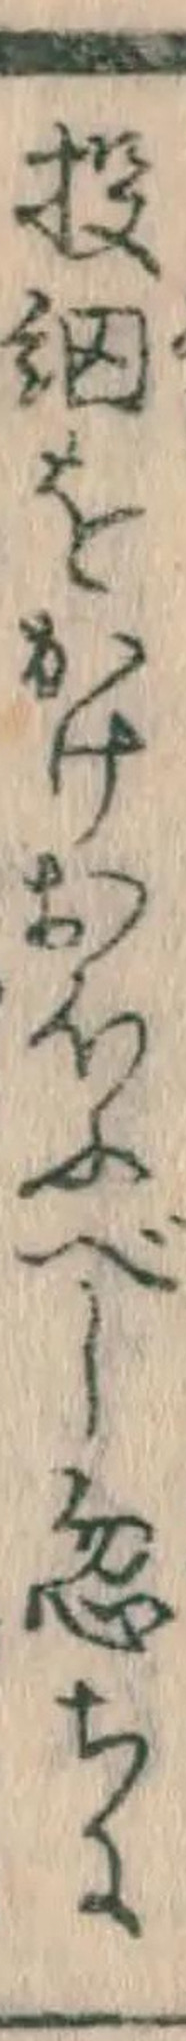投網をかけおほふべし忽ちに
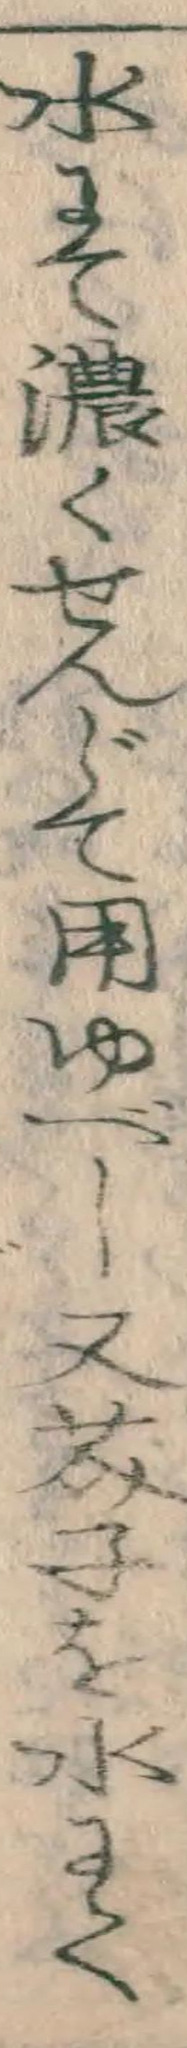水にて濃くせんじて用ゆべし又芥子を水にて
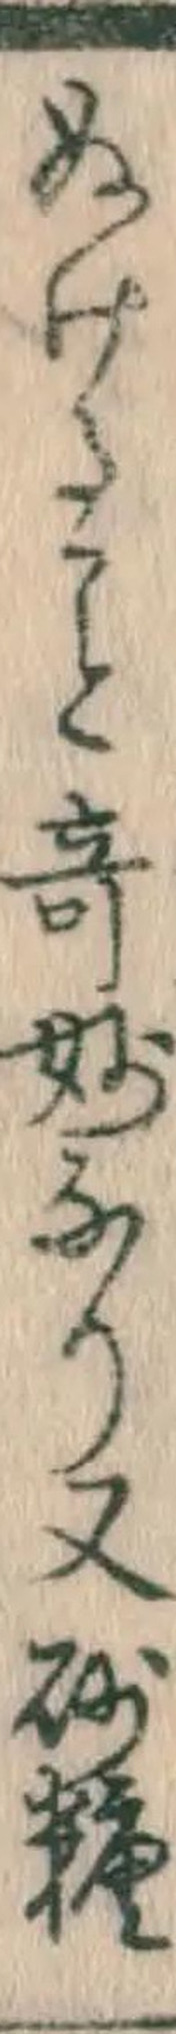ぬけること奇妙なり又砂糖
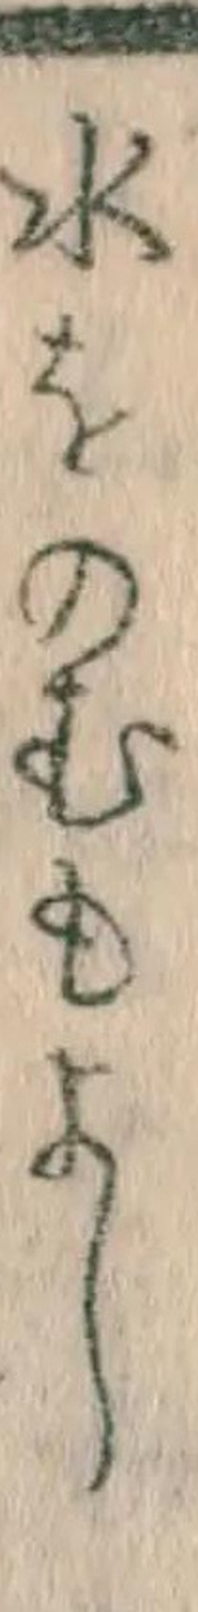水をのむもよし
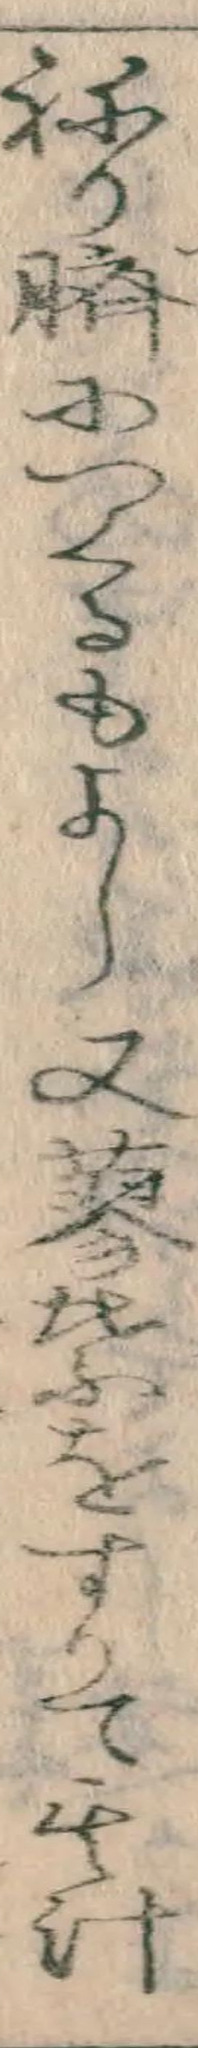ねり臍につくるもよし又蓼葉をすりて其汁
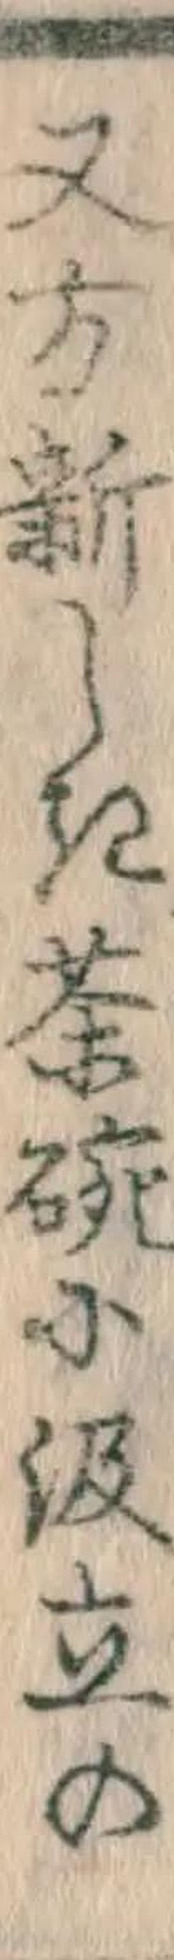又方新しき茶碗に汲立の
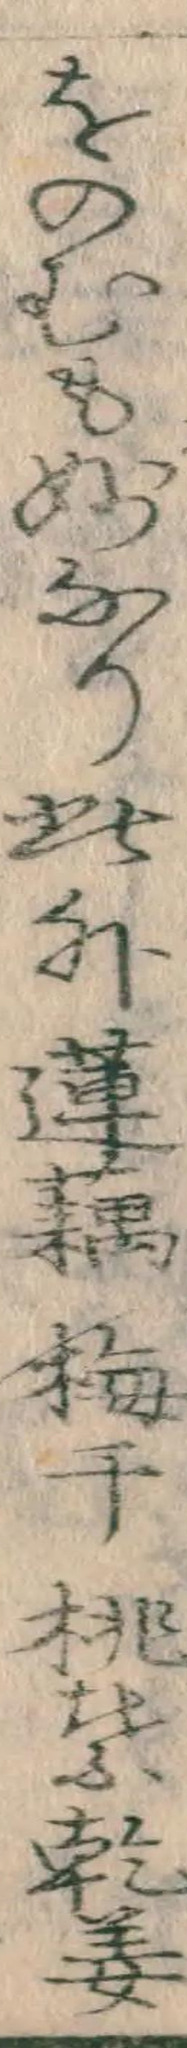をのむも妙なり此外蓮藕梅干桃葉乾姜
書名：広益秘事大全 3巻. [4]
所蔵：国立国会図書館 National Diet Library, JAPAN
